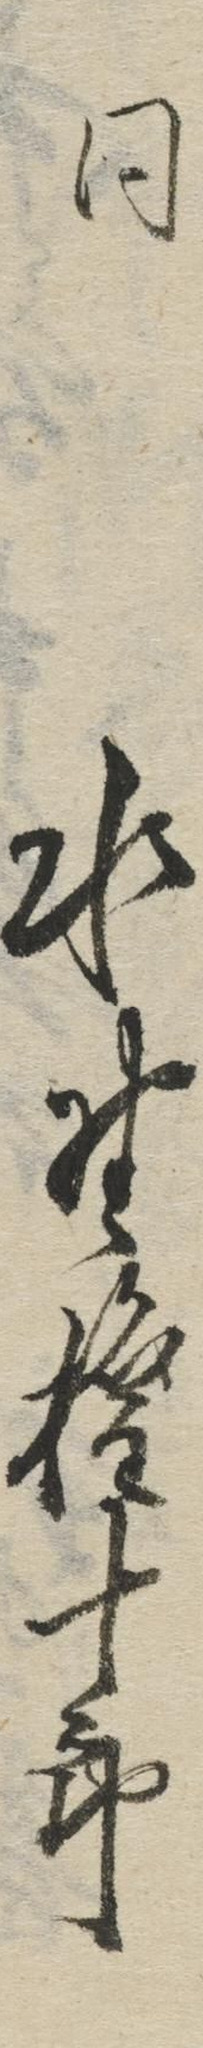同水野権十郎
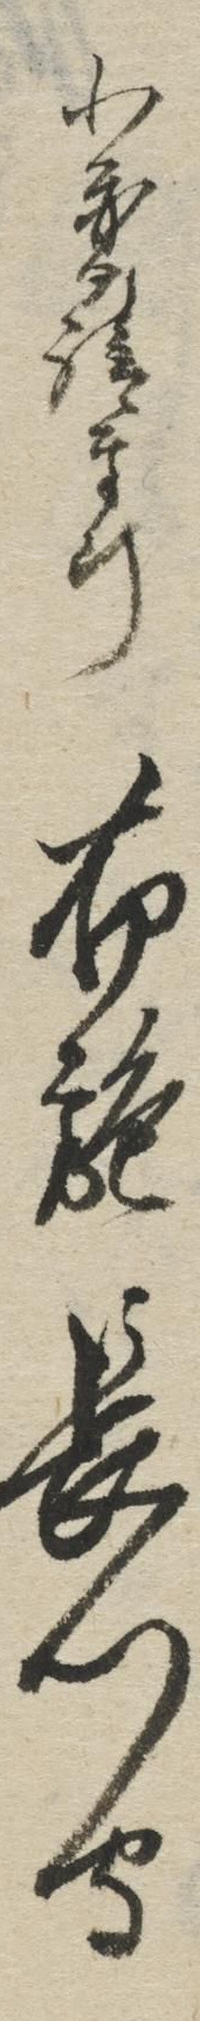小普請奉行布施長門守
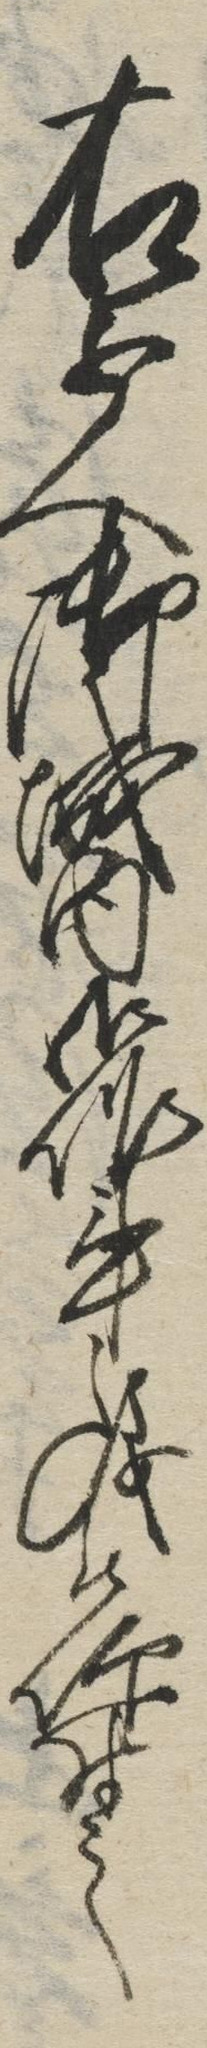右五人御城内御作事之儀被仰付之
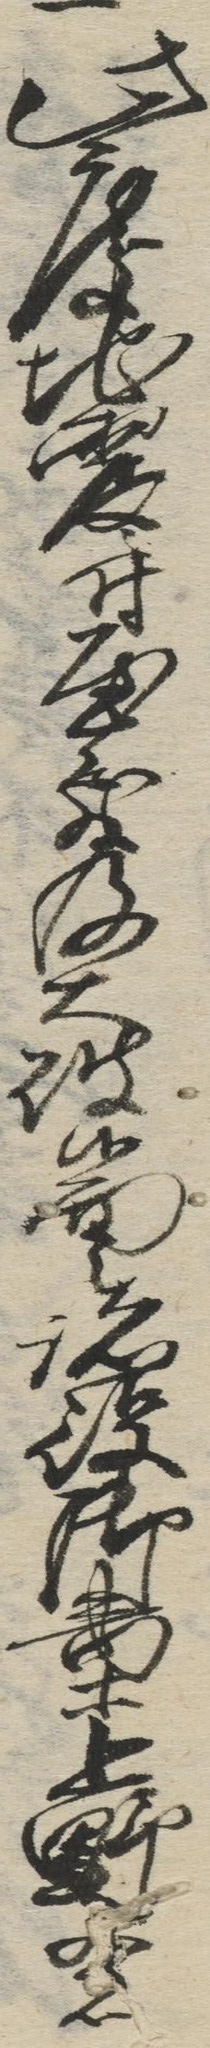一此度地震付屋敷及大破候面々諸役御番等上野
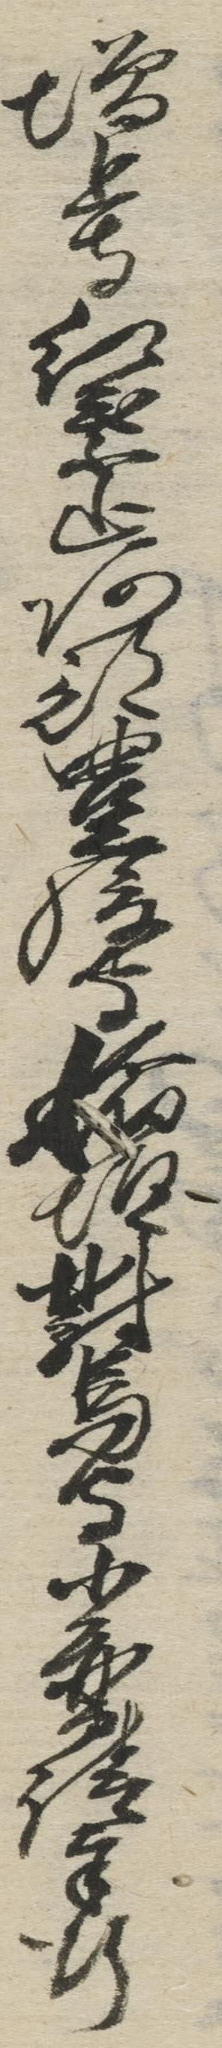増上寺紅葉山阿部豊後守稲垣対馬守小普請奉行
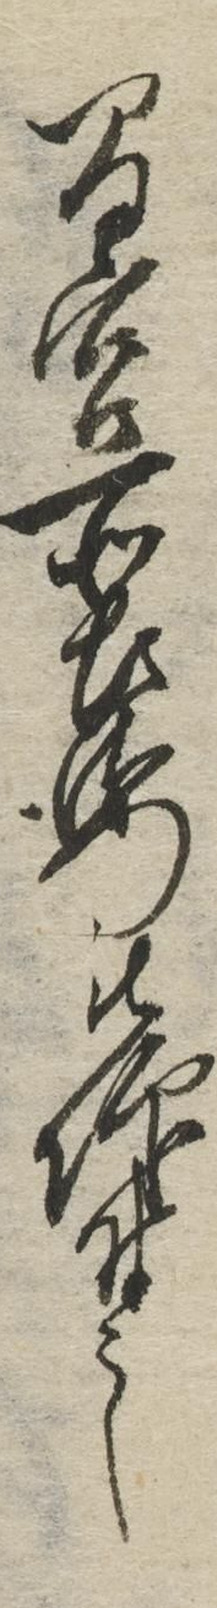間宮所左衛門被仰付之
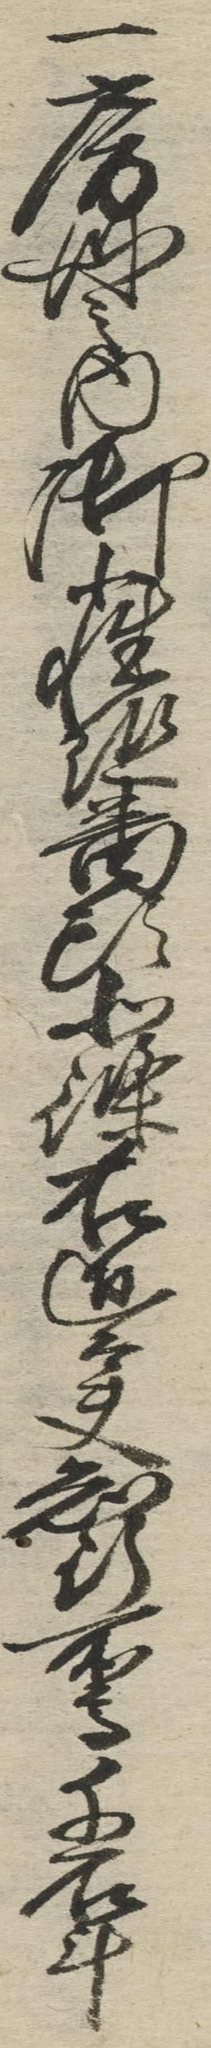一房州之内御小姓組番頭北條右近太夫知行所高千石斗
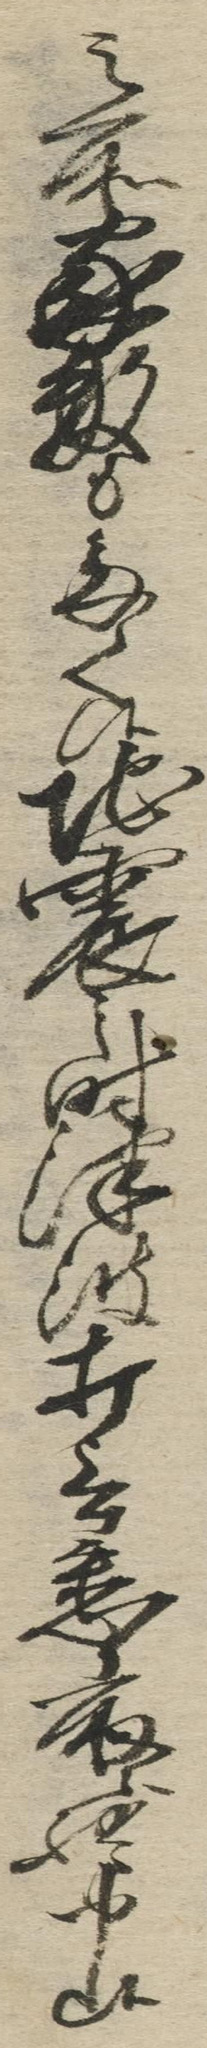之所家数も多く候地震之時津波打上ヶ悉取られ申候

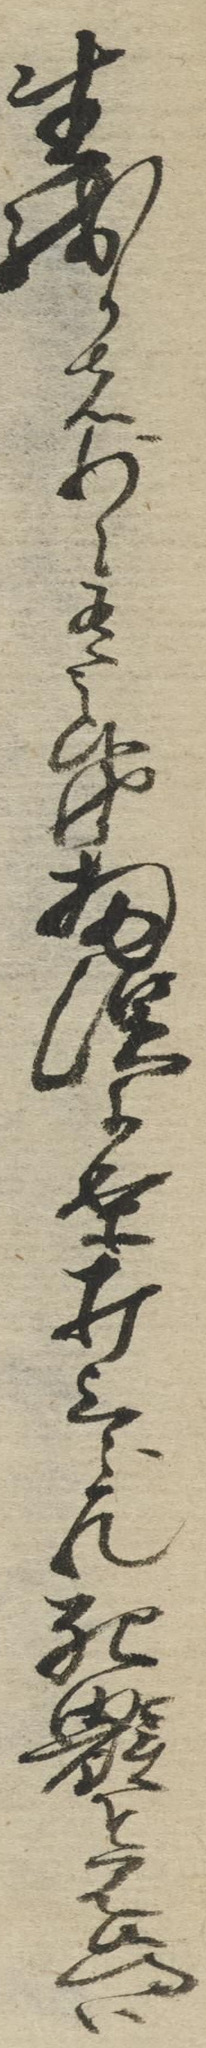生残り者少し有之候由当浜より打上られ死骸を見候得ハ
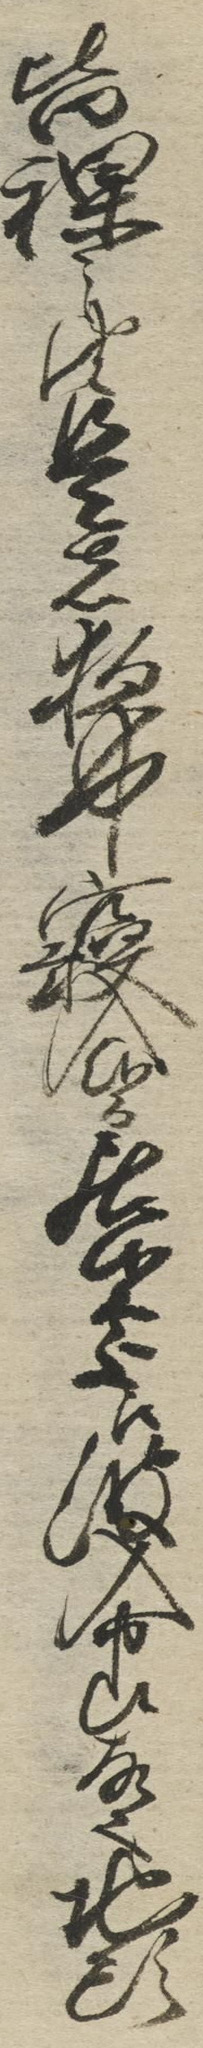皆裸之由是ハ夜中寝入候而罷出候処江波入申候故也地頭
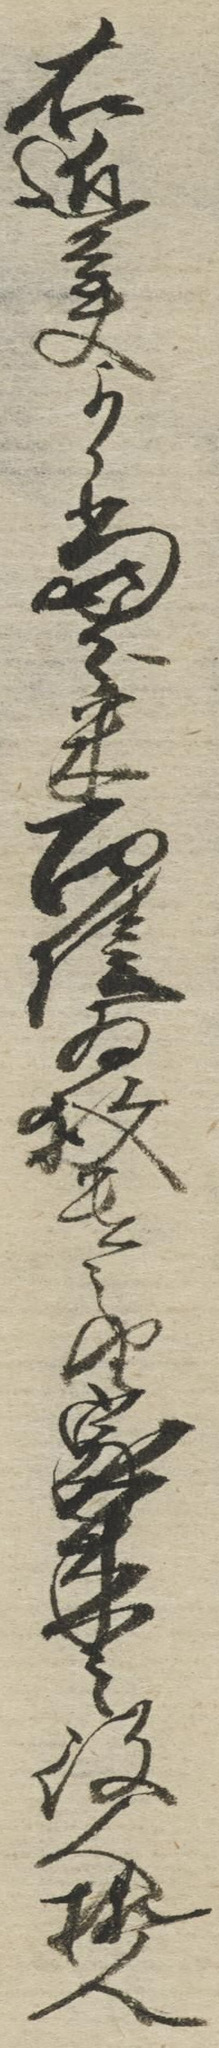右近太夫より当分米百俵為救遣之由家来之役人拾人
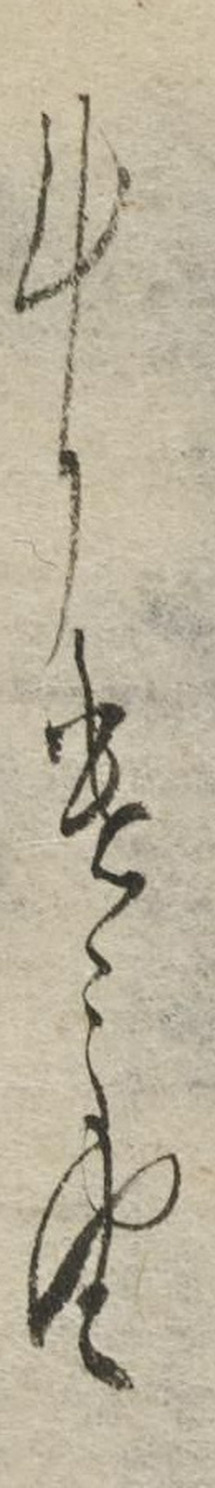斗り遣之由
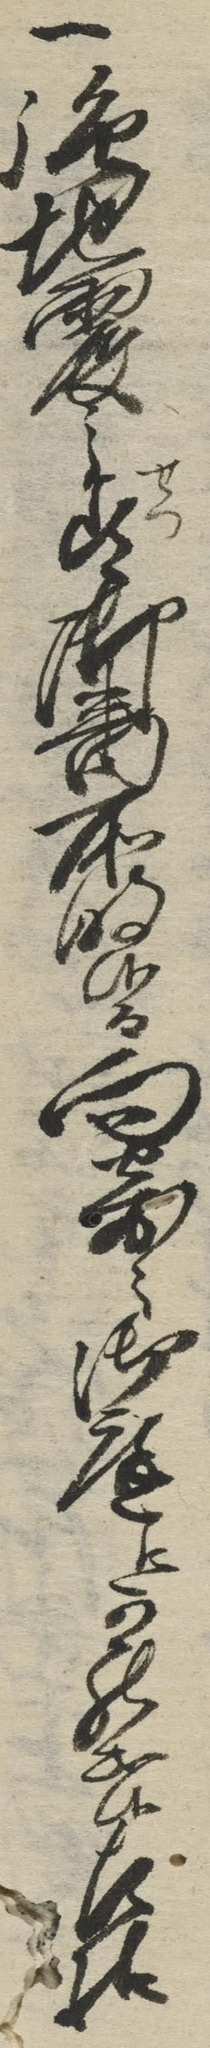一強地震之節せつ御番所明候而向寄之御庭江可罷出候左様
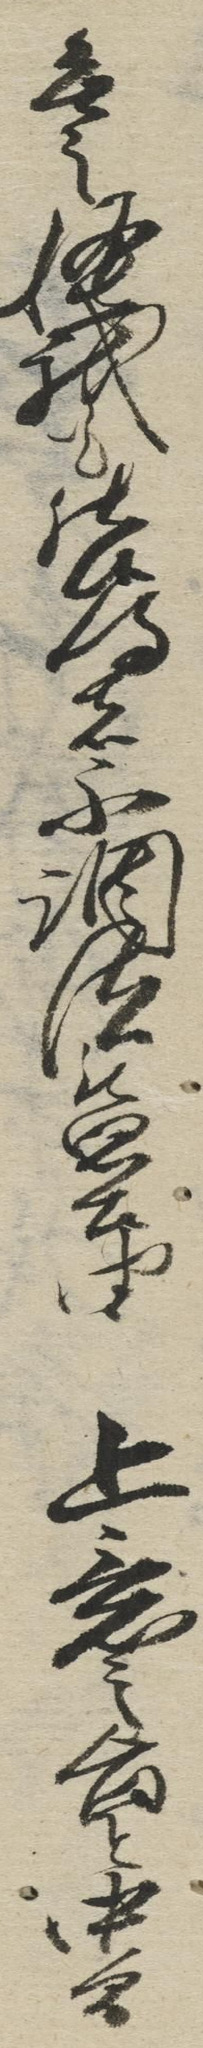無之怪我も仕候得は不調法被思召御上意之旨を中ノ間
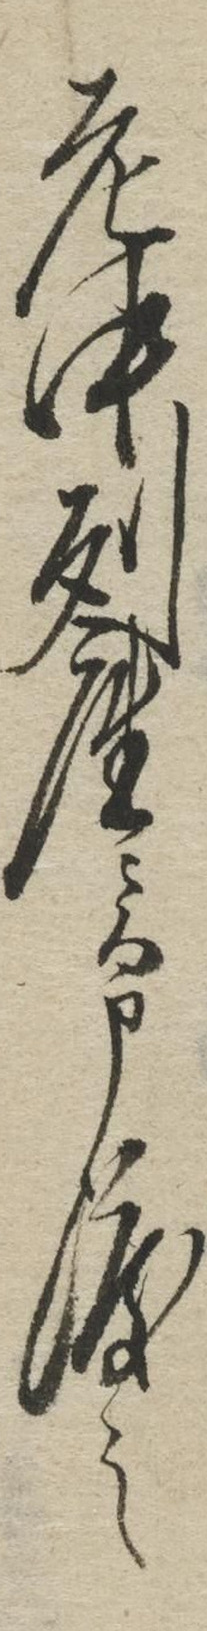老中列座二而申渡之
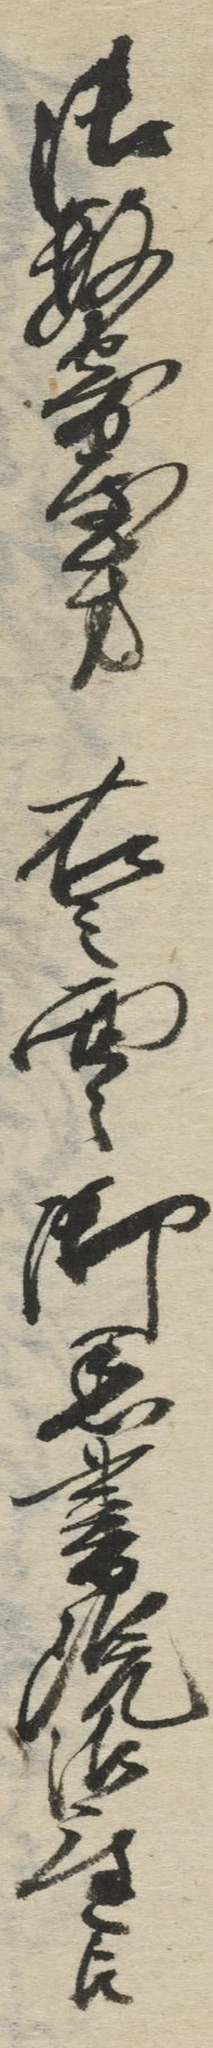御数寄屋方右之面々御黒書院御付江
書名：元禄地震記
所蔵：東京大学地震研究所図書室 Earthquake Research Institute Library, The University of Tokyo, JAPAN
